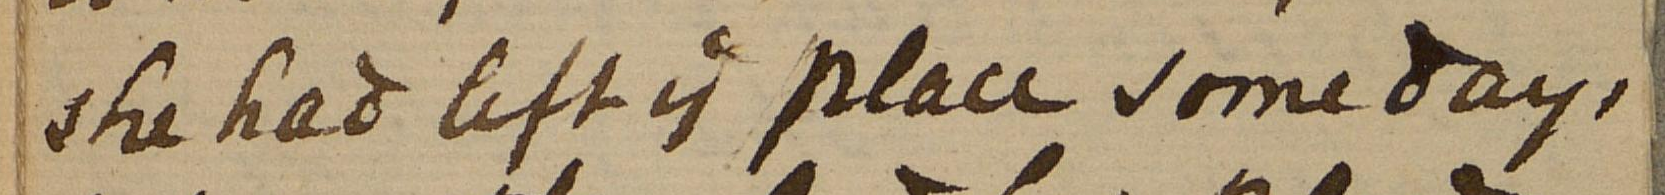she had left y^e place some days
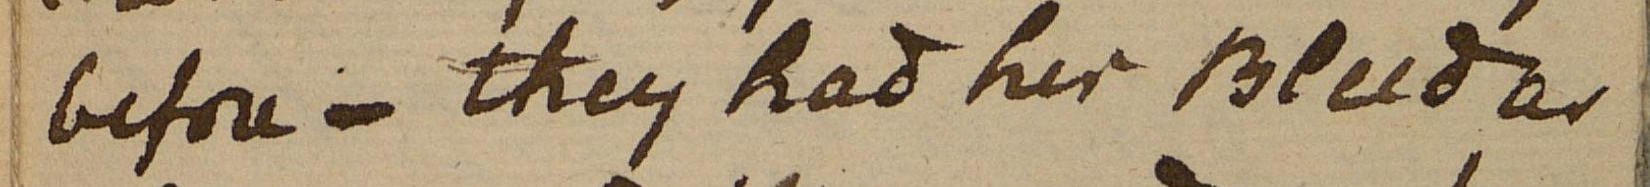before- they had her Bleed as
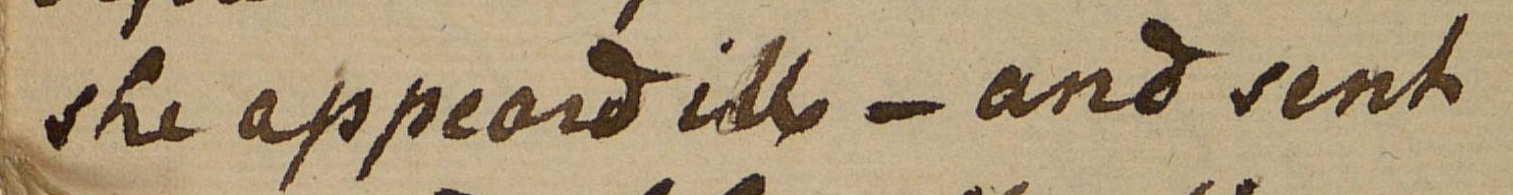she appeard ill- and sent
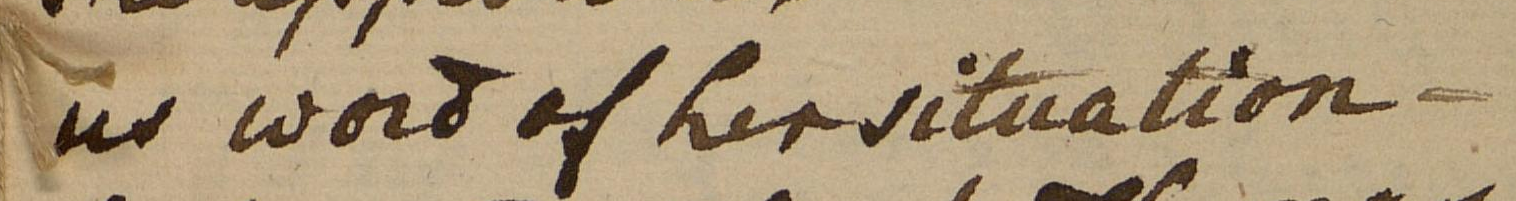us word of her situation-
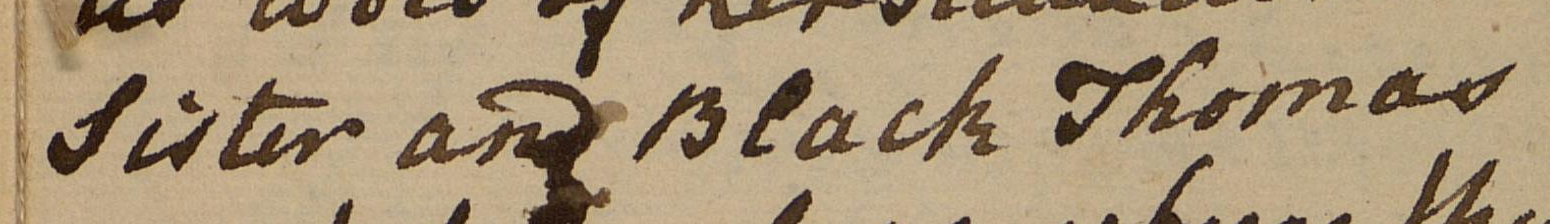Sister an Black Thomas
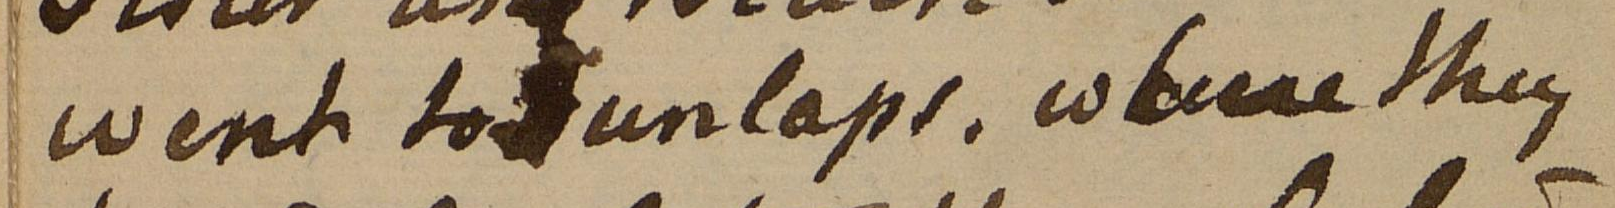went to Dunlaps, where they
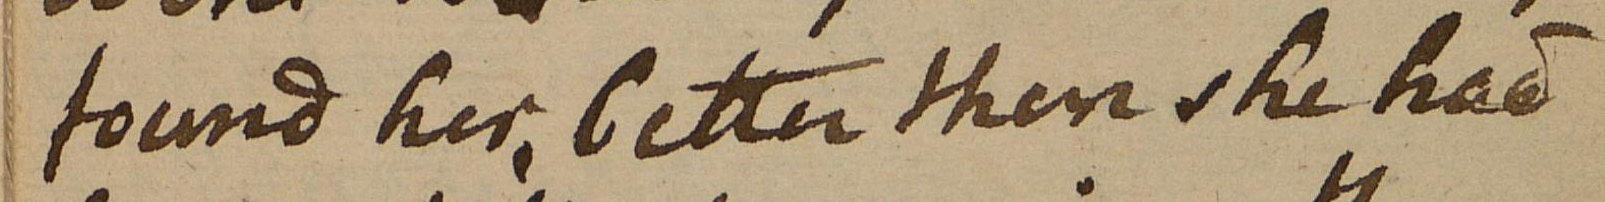found her, better then she had
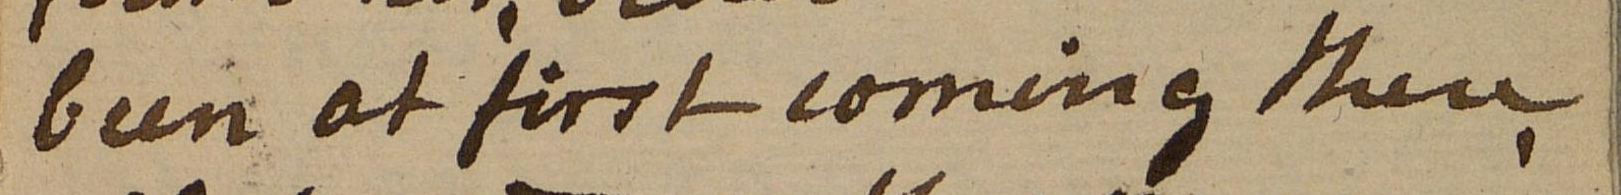been at first coming there,
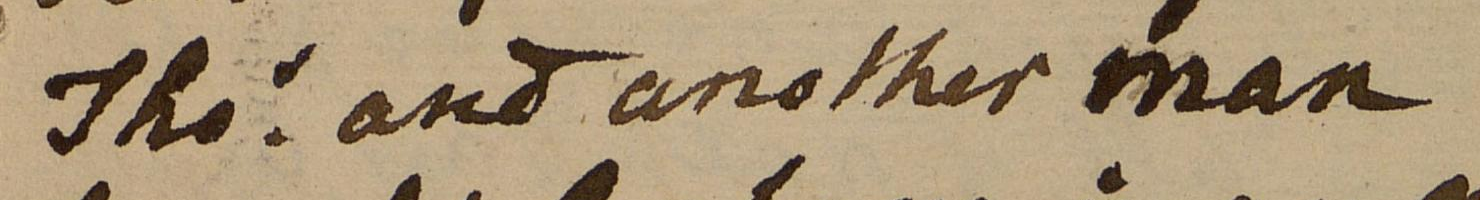Tho^s. and another man
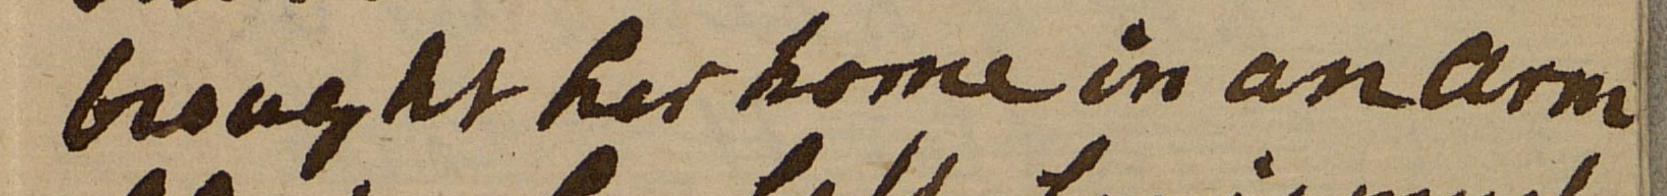brought her home in an arm
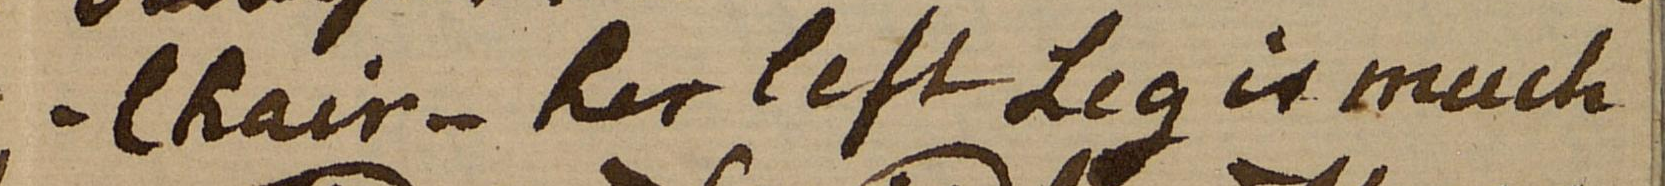-Chair- her left Leg is much
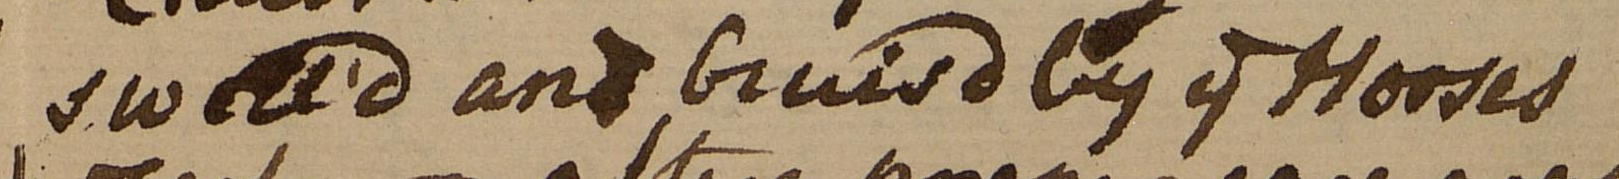swell'd and bruisd by y^e Horses
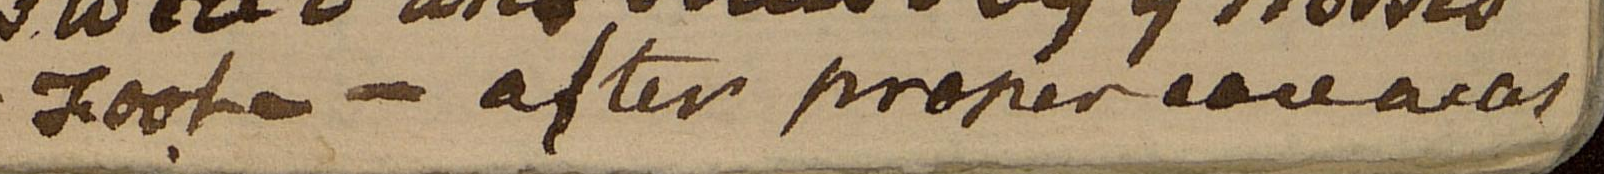Foot- after proper care a as
